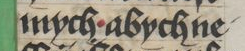mych.abych ne¬
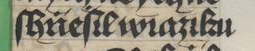ſhṙíeẛil wiaziku
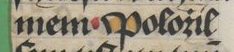mem.Polożil
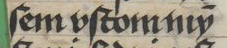ſem vſtom mȳ
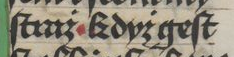ſtraž.když geſt
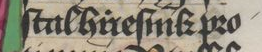ſtal hṙieſník pro¬
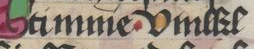ti mnie.Vmlkl
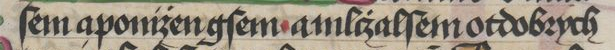ſem aponíżen gſem.a mlcżalſem otdobrých
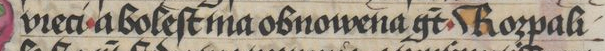viecí.a boleſt ma obnowena ḡt.Rozpali¬
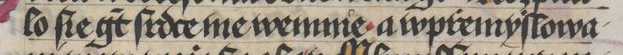lo ſie ḡt ſrdce me wemnie.a wpṙemyẛlowa¬
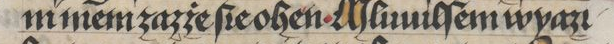ní mem zazže ſie ohen.Mluuilſem wyazi¬
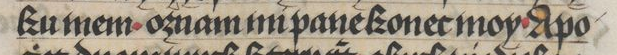ku mem.oznam mi pane konec moy.Apo¬
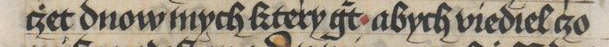cżet dnow mych ktery ḡt.abych viediel czo¬
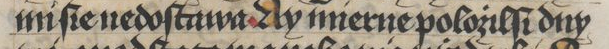mi ſie nedoſtawa.Ay míerne polożilſi dny
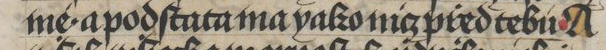mé.apodſtata ma yako nicz pṙed tebú.A
